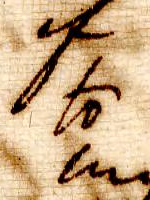to
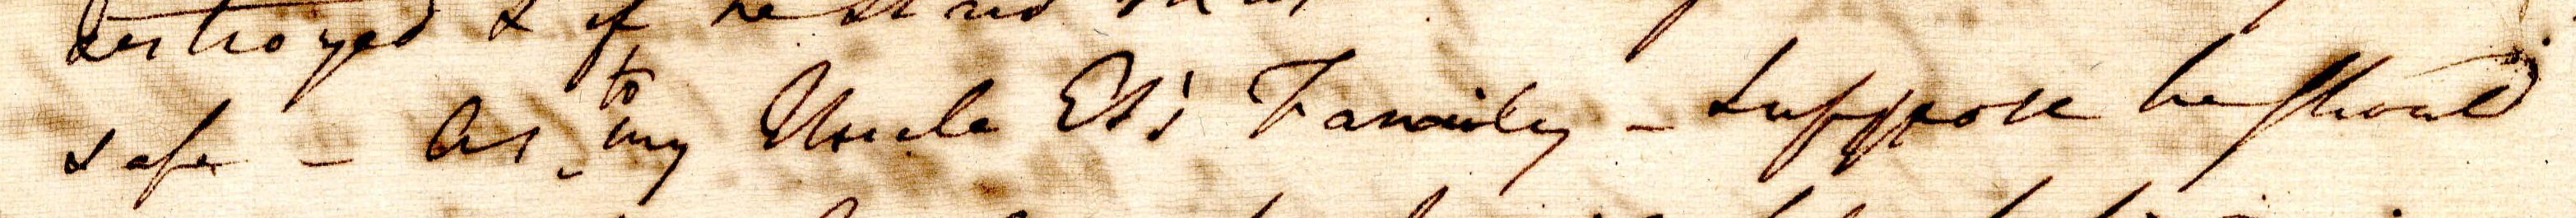safe- As ^ my Uncle El's Family- Suppose he should
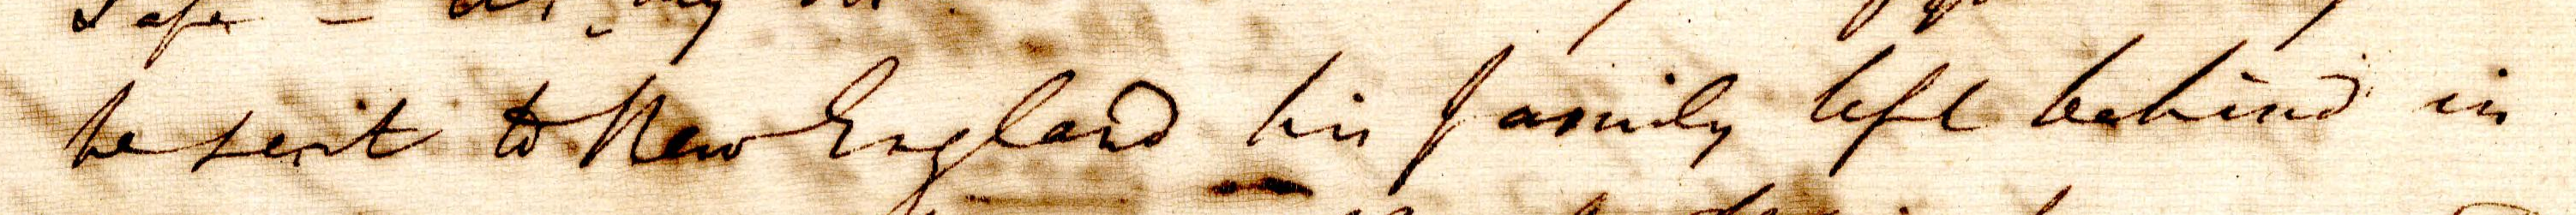be sent to New England his family left behind in
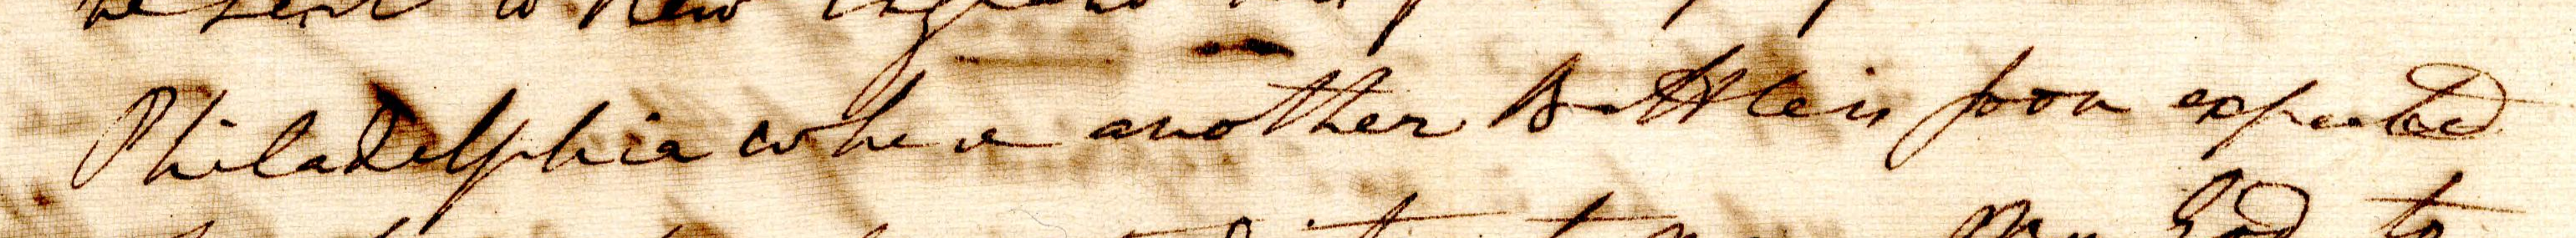Philadelphia where another Battle is soon expected
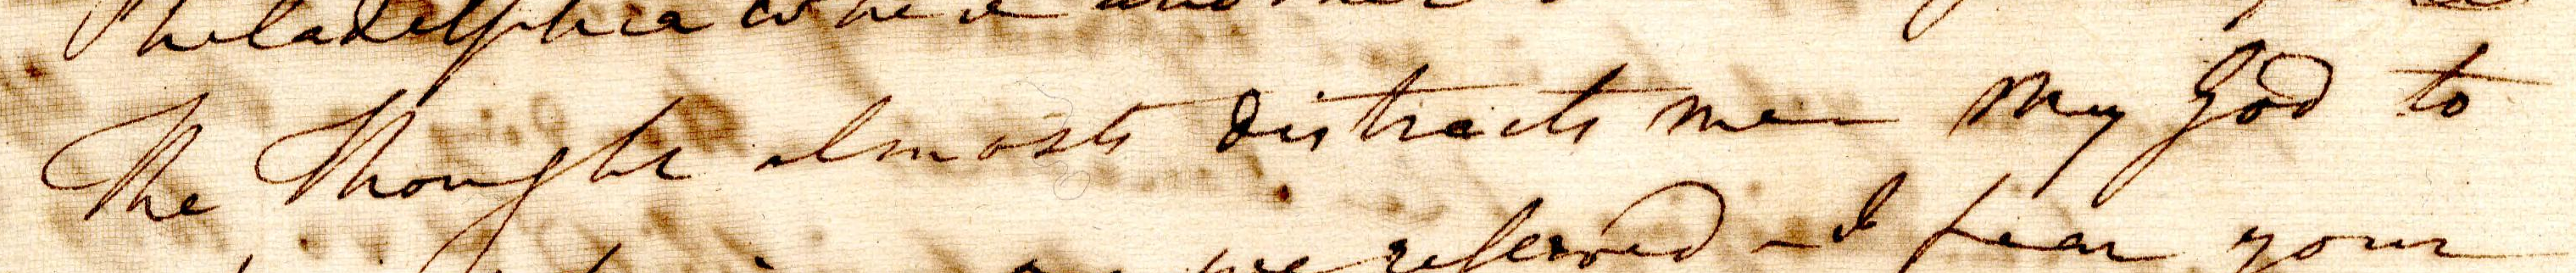The Thought almost distracts me my god to
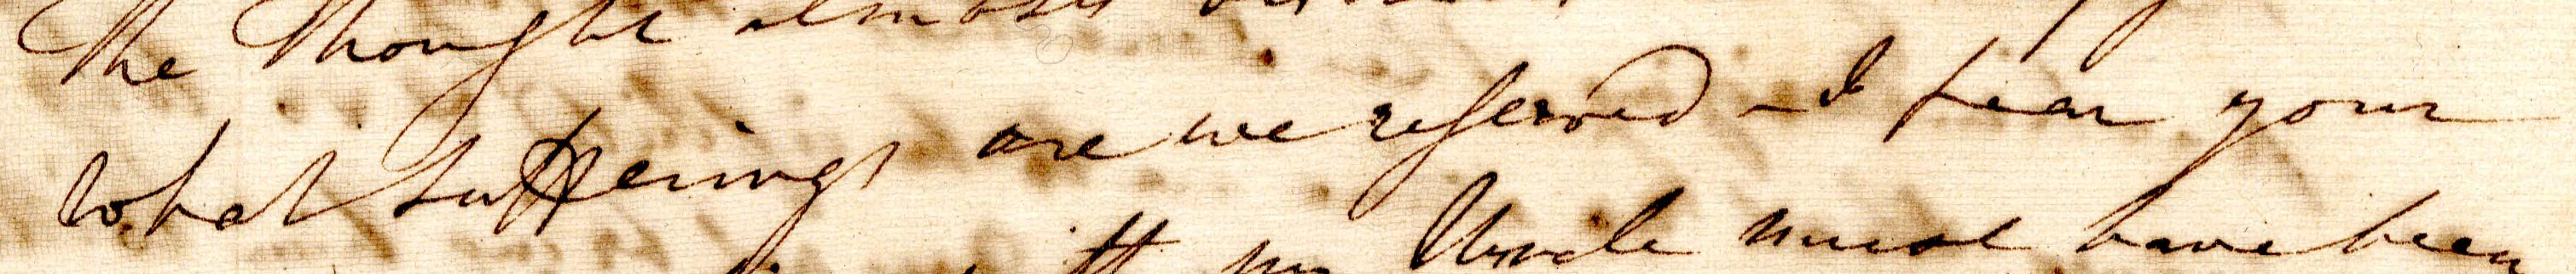what sufferings are we reserved- I fear your
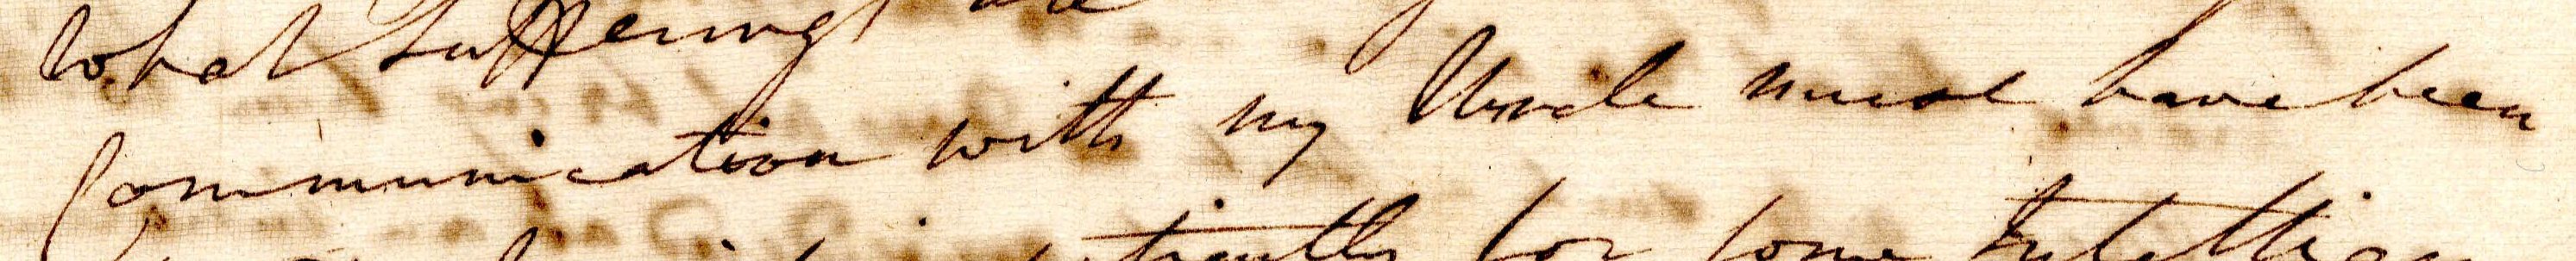Communication with my Uncle must have been
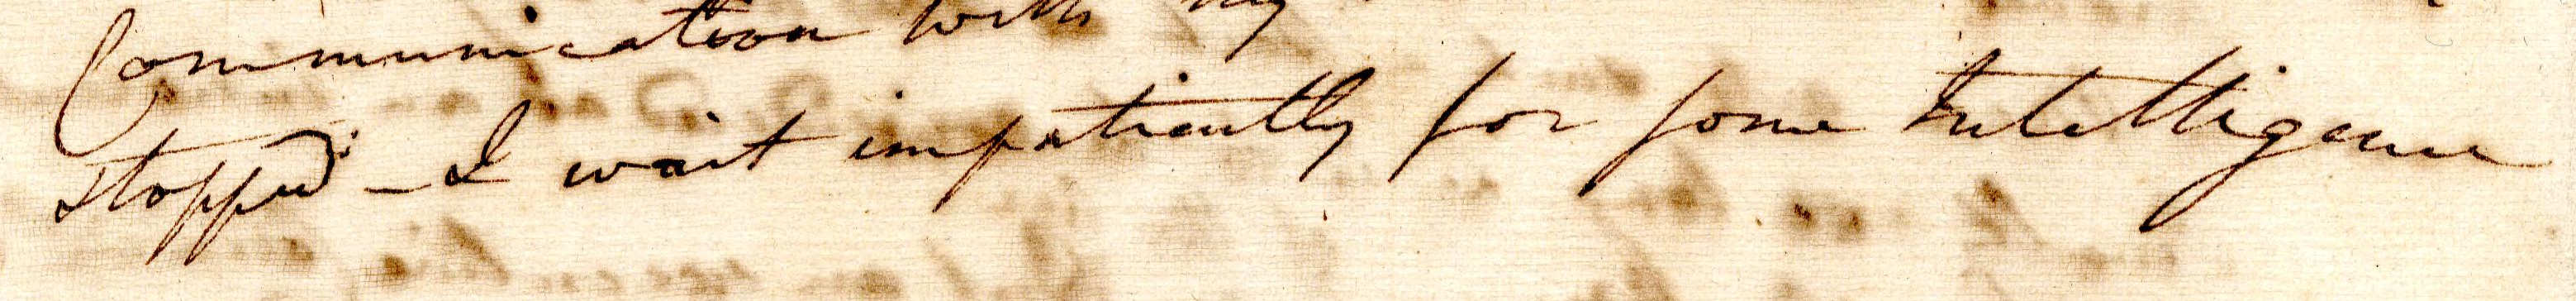stopped- I wait impatiently for some Intelligence
